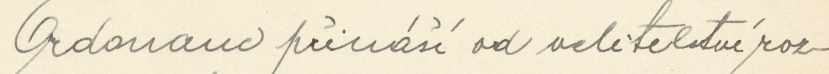Ordonanc přináší od velitelství roz-
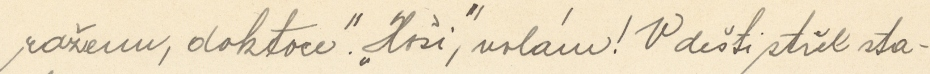raženu, doktore.” „Hoši,” volám! V dešti střel sta-
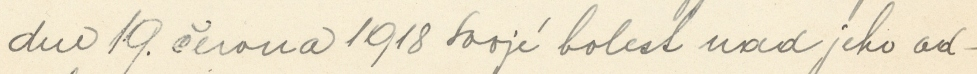dne 19. června 1918 svojí bolest nad jeho od-
